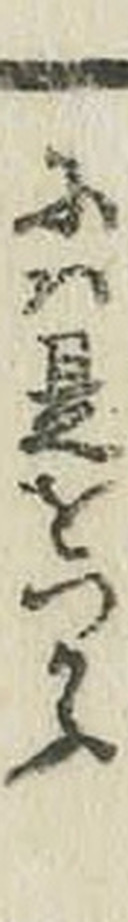には是をつかふ
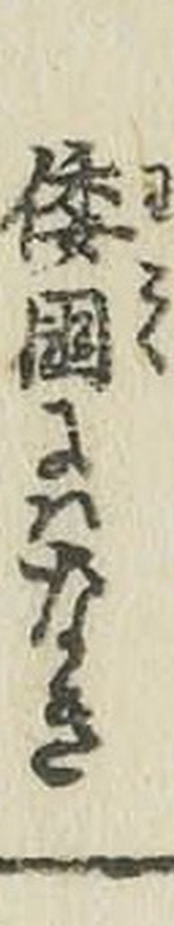倭国にはなき
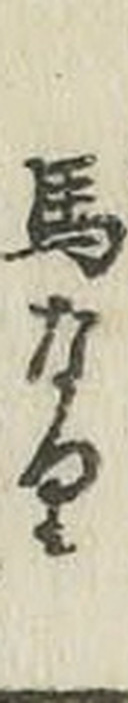馬なり
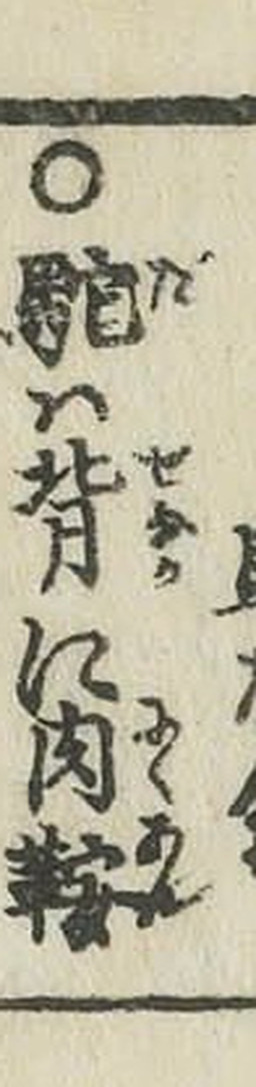○駝は背に肉鞍
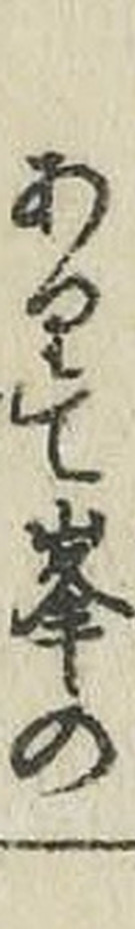ありて峯の
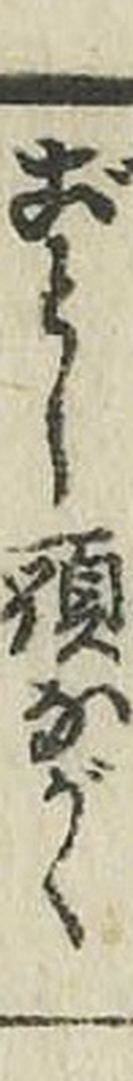ごとし頸ながく
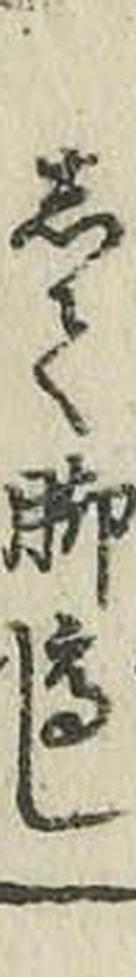して脚高し
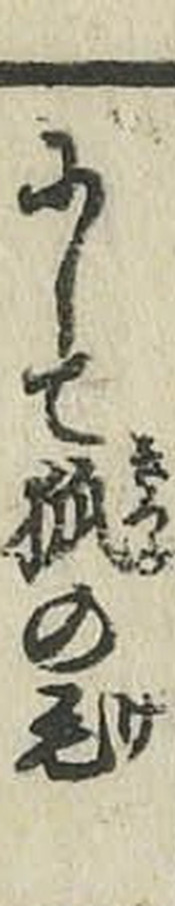にして狐の毛
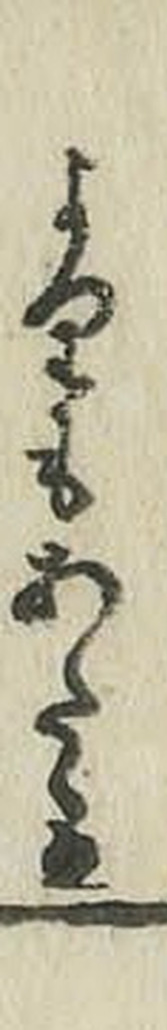よりもあたゝか
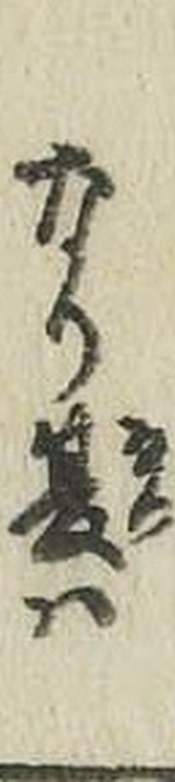なり夏は

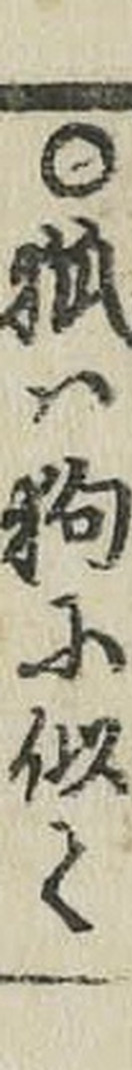○狐は狗に似て
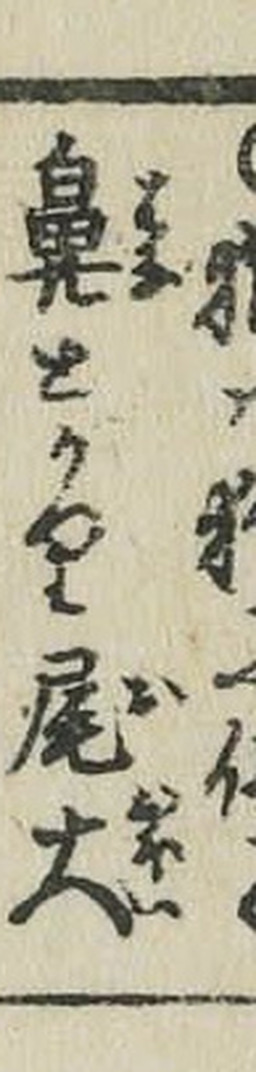鼻とかり尾大
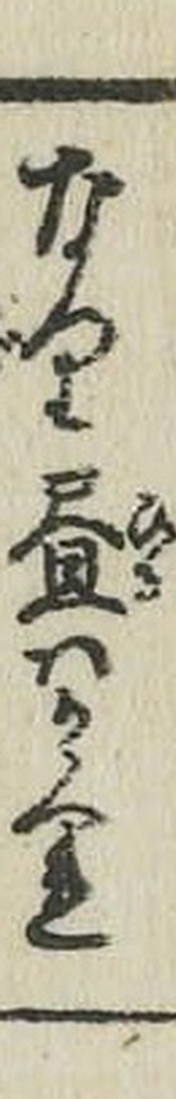なり昼はかくれ
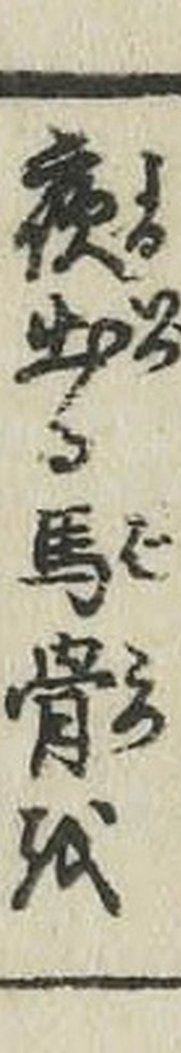夜出る馬骨を
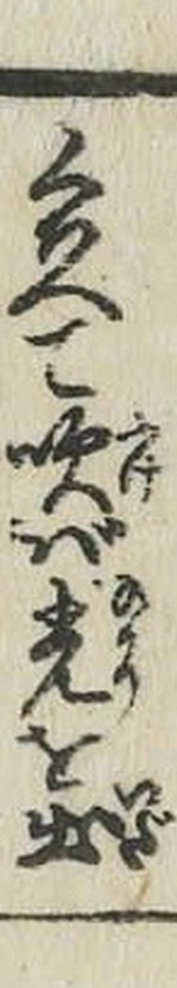くはへて吹ば光を出
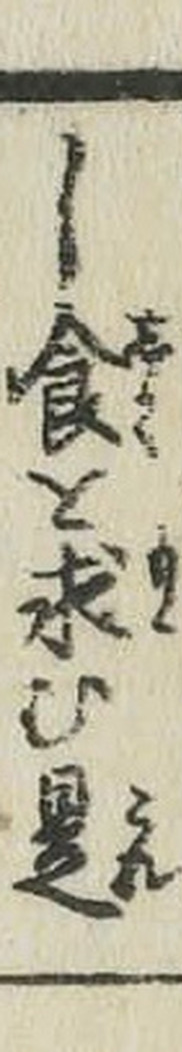し食を求む是
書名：増補頭書訓蒙図彙大成 10巻 6:巻之12-13
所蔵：東京学芸大学教育コンテンツアーカイブ
